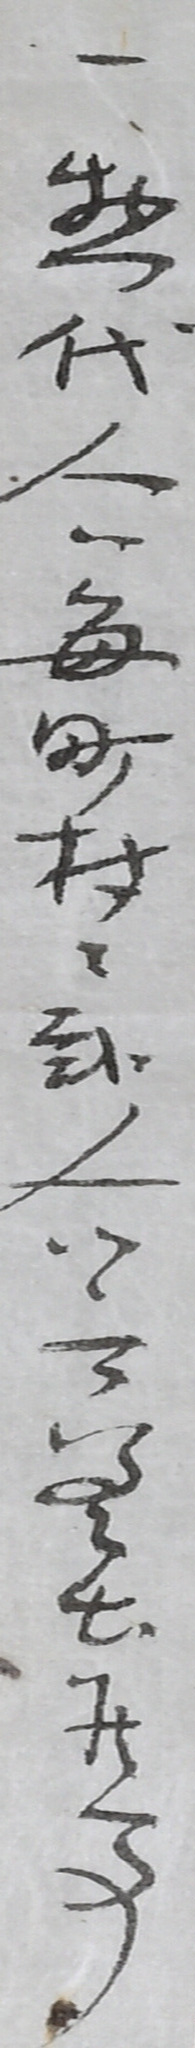一惣代人ハ毎町村ニ弐人ツヽ可差出候事
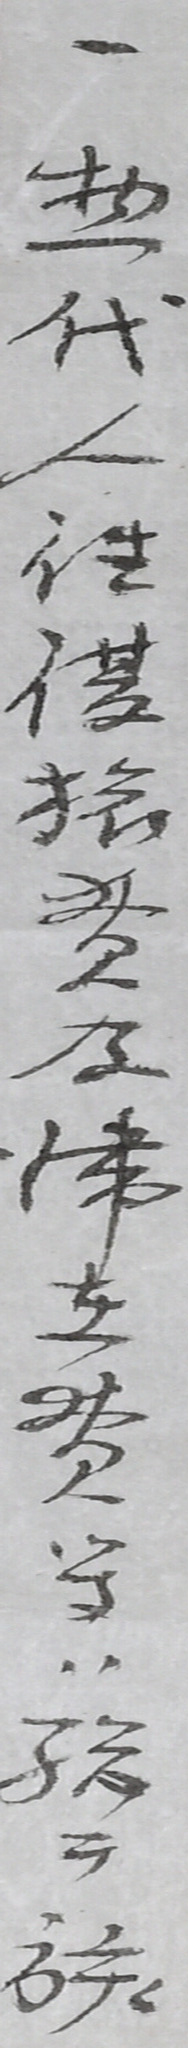一惣代人往復旅費及滞在費等ハ総テ該
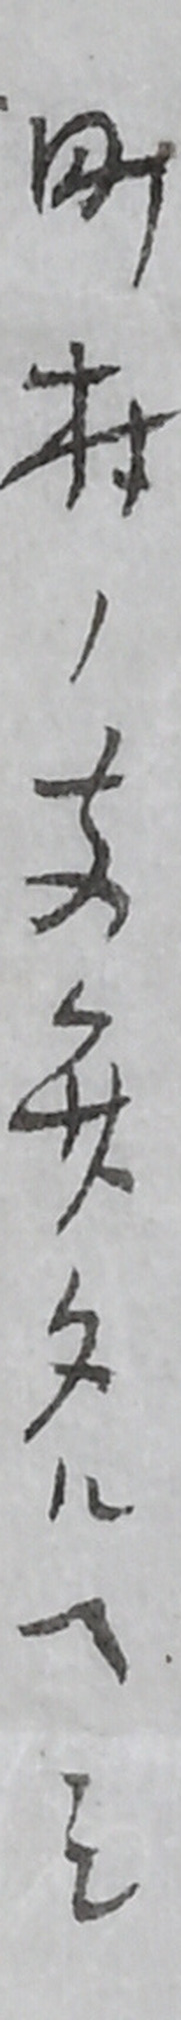町村ノ支弁タルヘシ
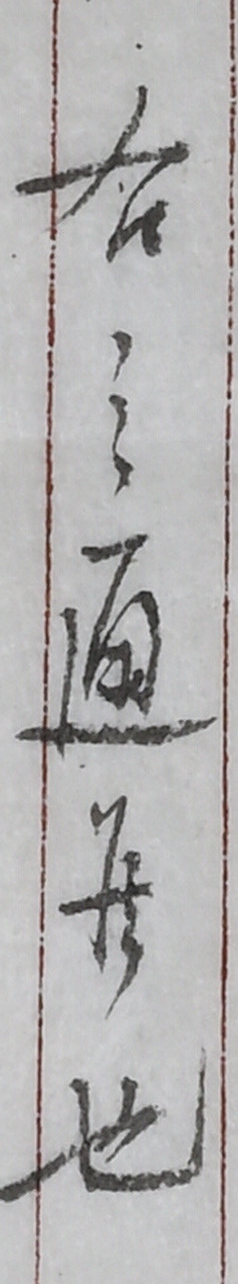右之通候也
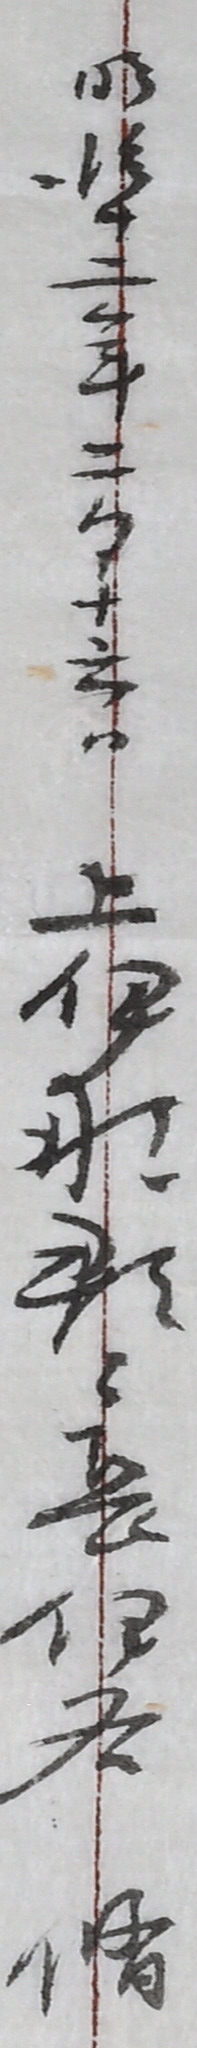明治十二年二月十六日上伊那郡々長伊谷脩
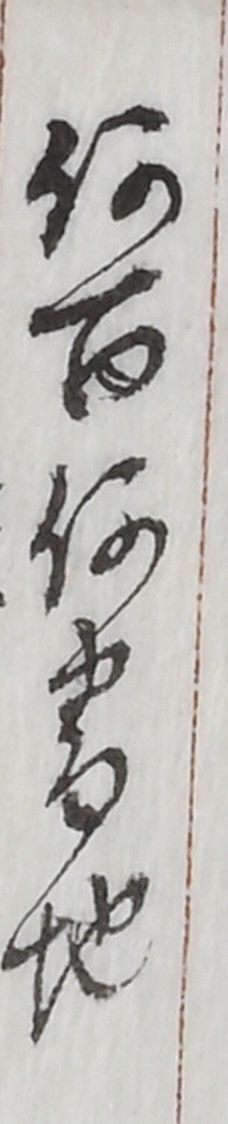何百何番地
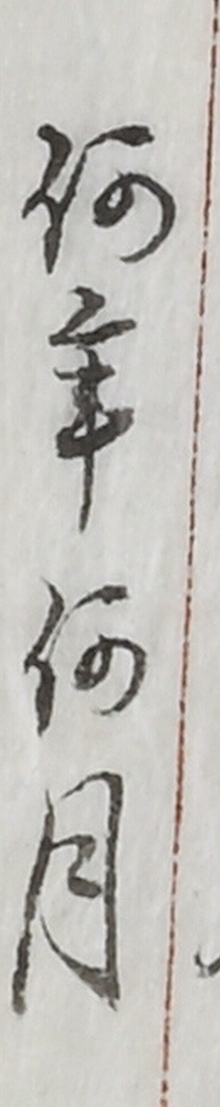何年何月
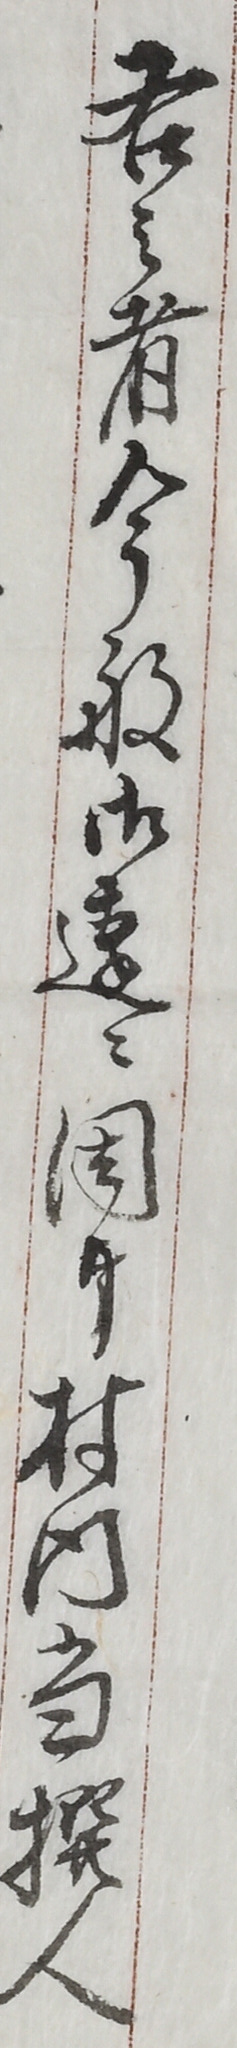右之者今般御達ニ因り村内当撰人
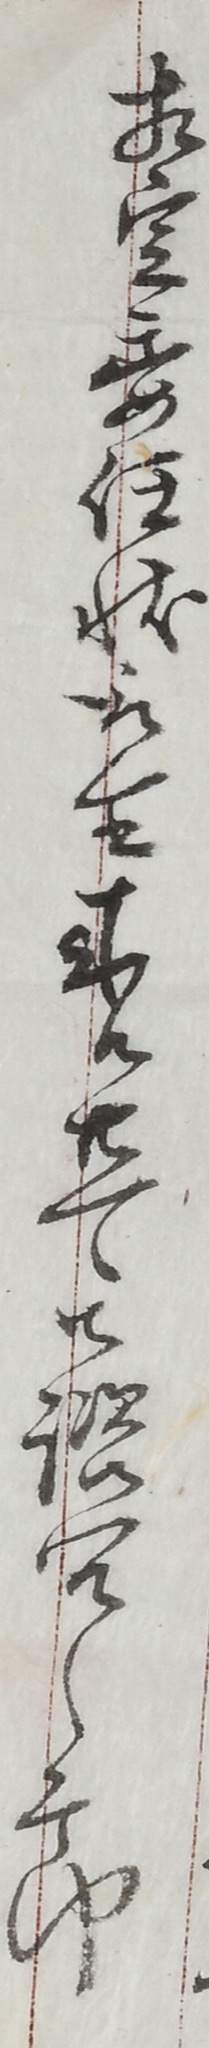相定委任状取置来ル廿一日御諮問之節

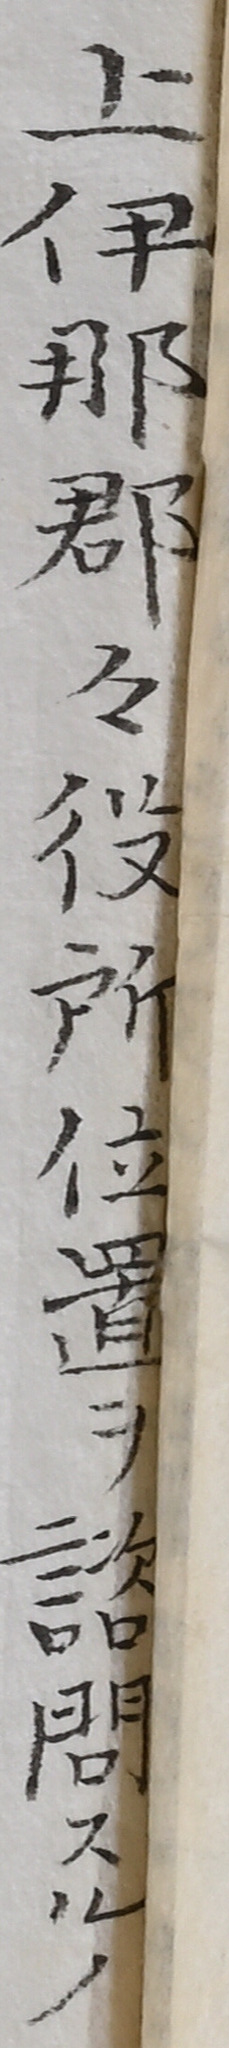上伊那郡々役所位置ヲ諮問スルノ
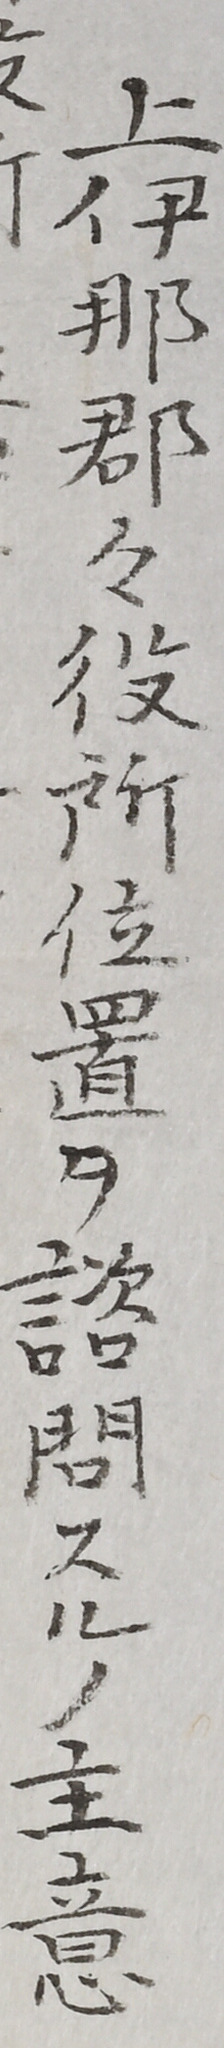上伊那郡々役所位置ヲ諮問スルノ主意
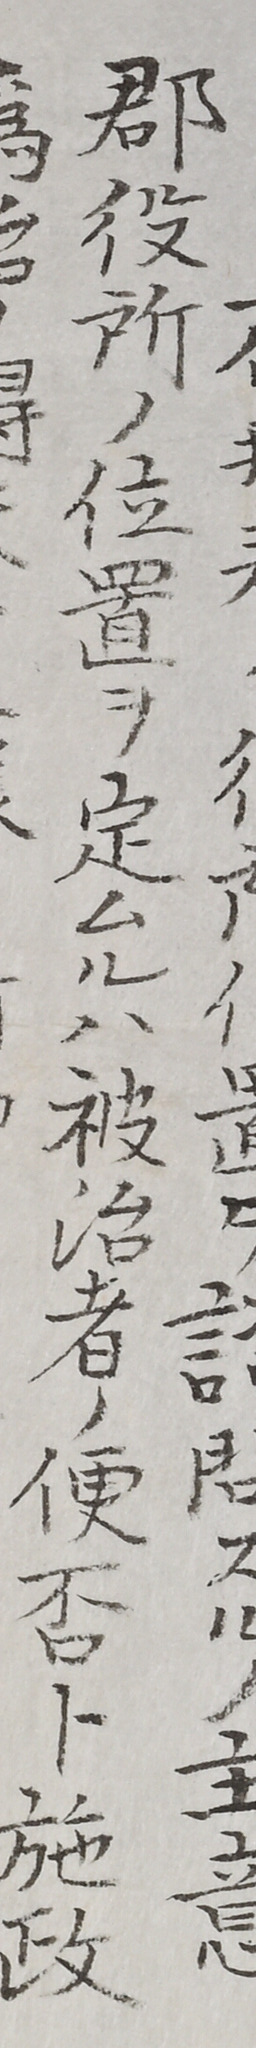郡役所ノ位置ヲ定ムルハ被治者ノ便否ト施改
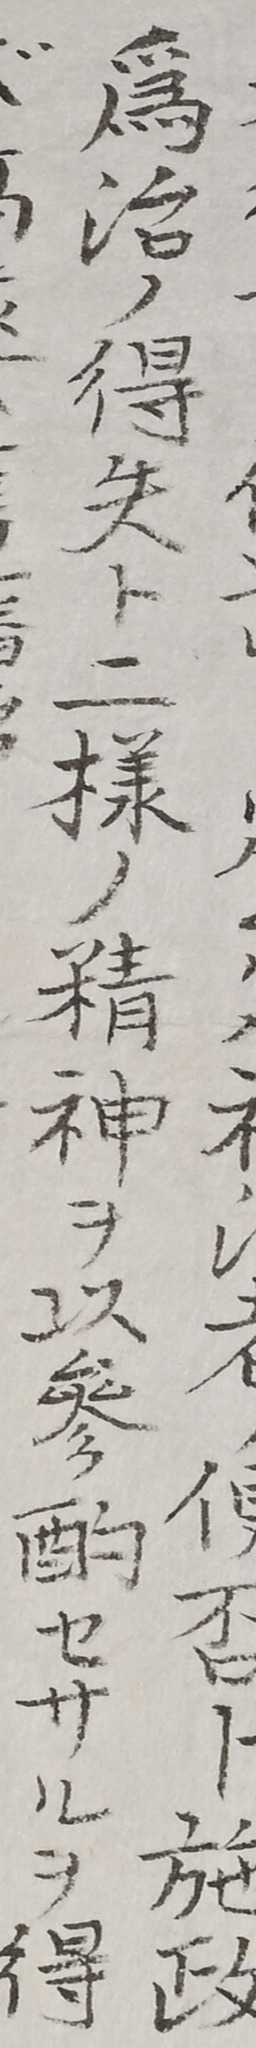為治ノ得失ト二様ノ精神ヲ以参酌セサルヲ得
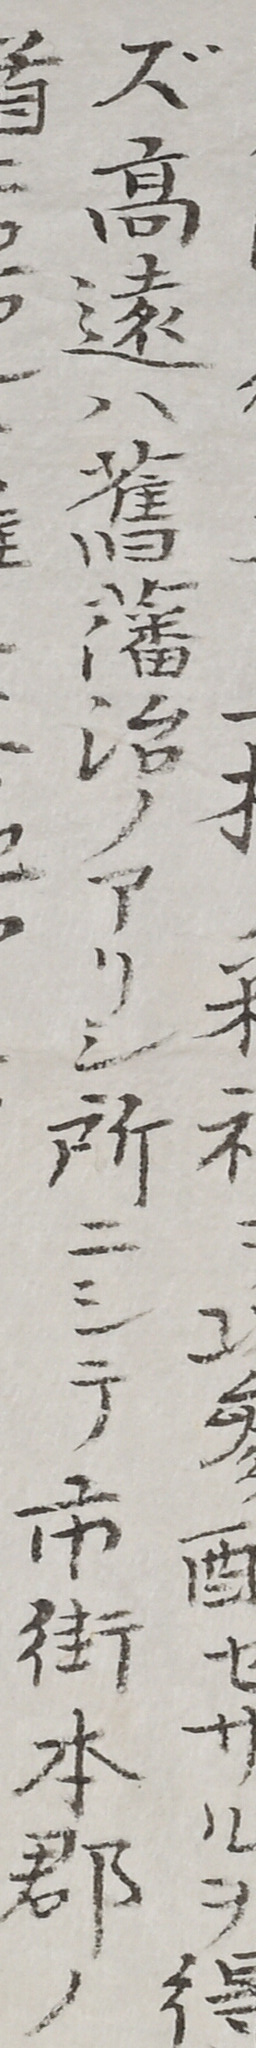ズ高遠ハ旧藩治ノアリシ所ニシテ市街本郡ノ
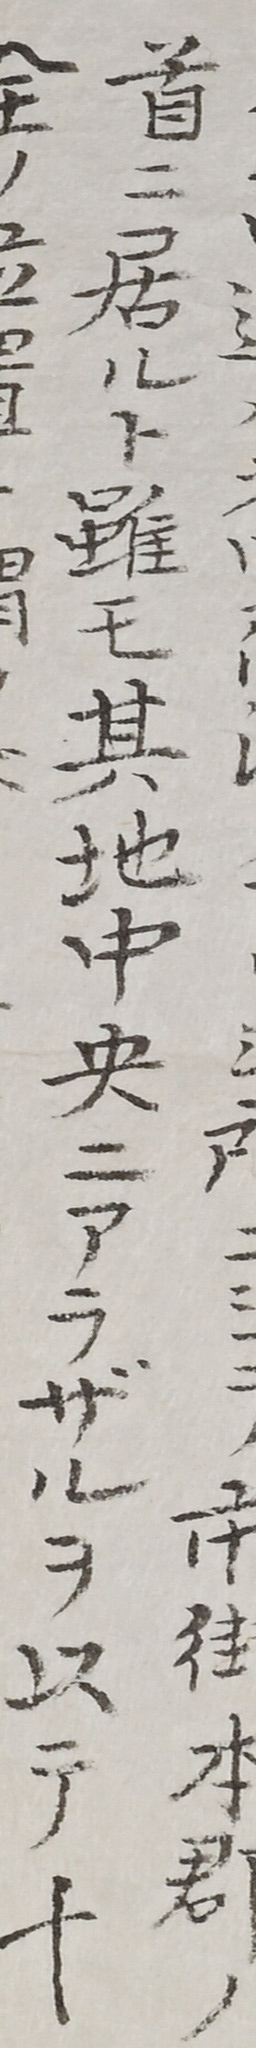首ニ居ルト雖モ其地中央ニアラザルヲ以テ十
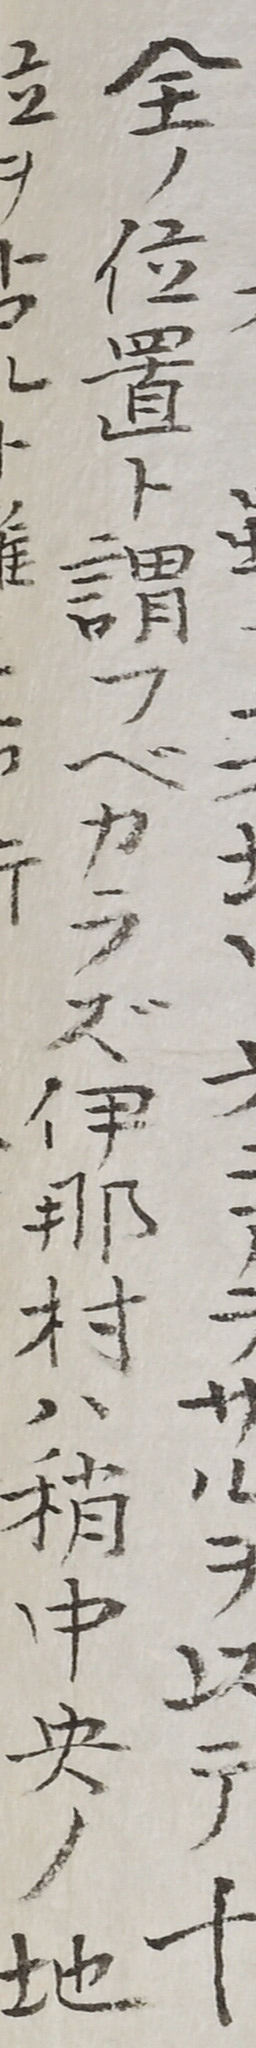全ノ位置ト謂フベカラズ伊那村ハ稍中央ノ地
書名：郡役所勤務中御用抜書
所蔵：伊那市立高遠町図書館・合同会社AMANE
